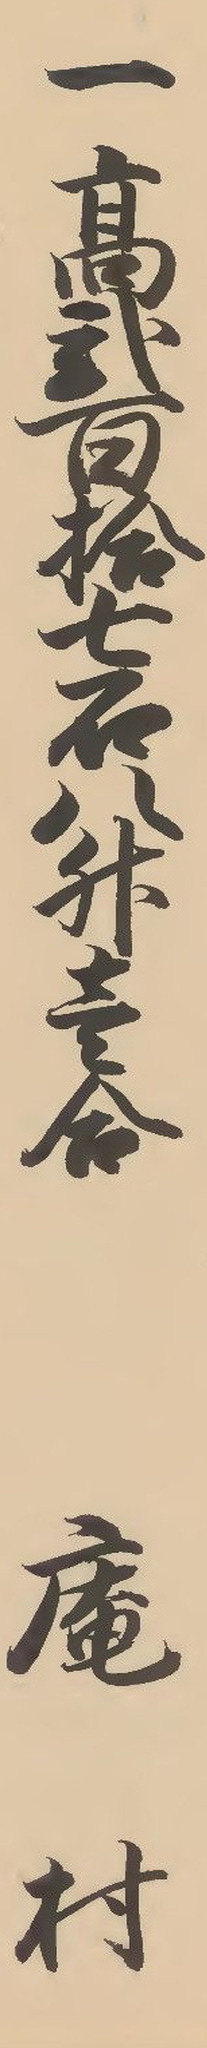一髙弐百拾七石八升壱合庵村
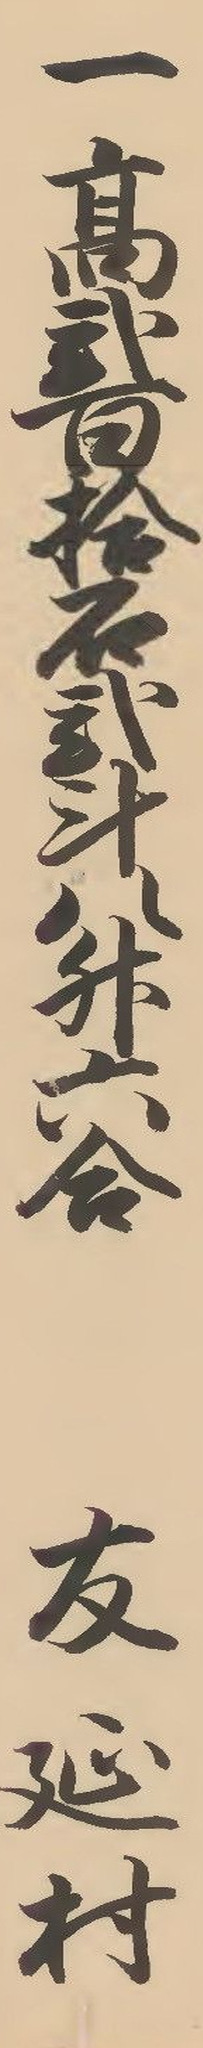一髙弐百拾石弐斗八升六合友延村
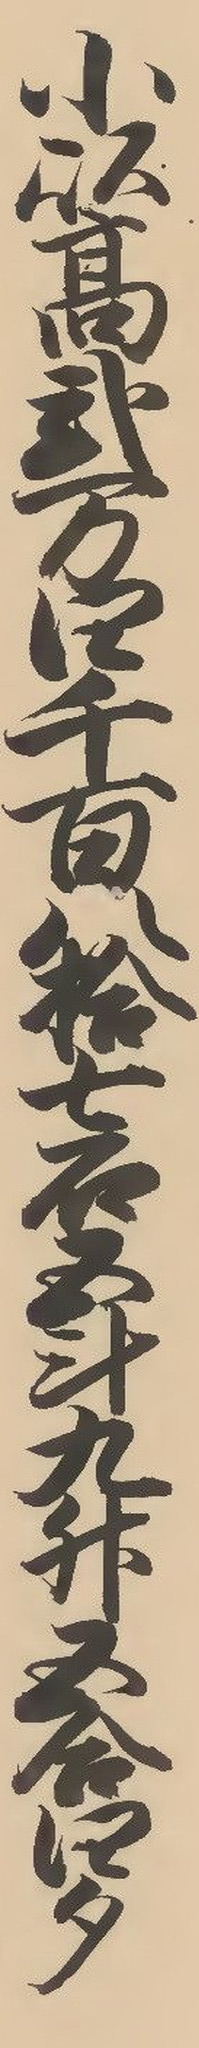小以髙二万四千百八拾七石五斗九升五合四夕

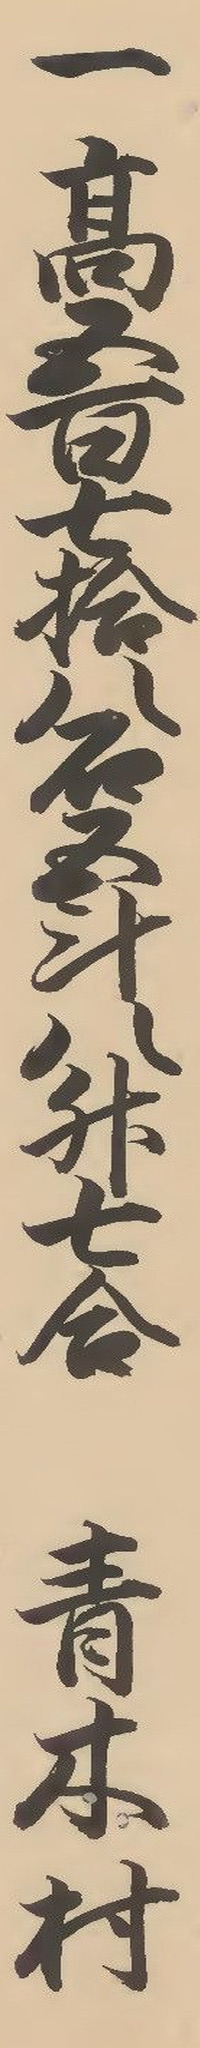一髙五百七拾八石五斗八升七合青木村
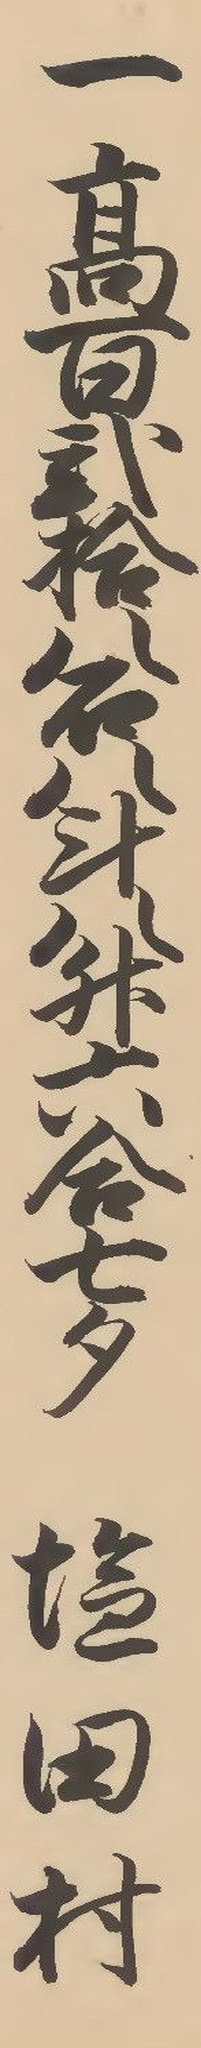一髙百弐拾八石八斗八升六合七夕塩田村
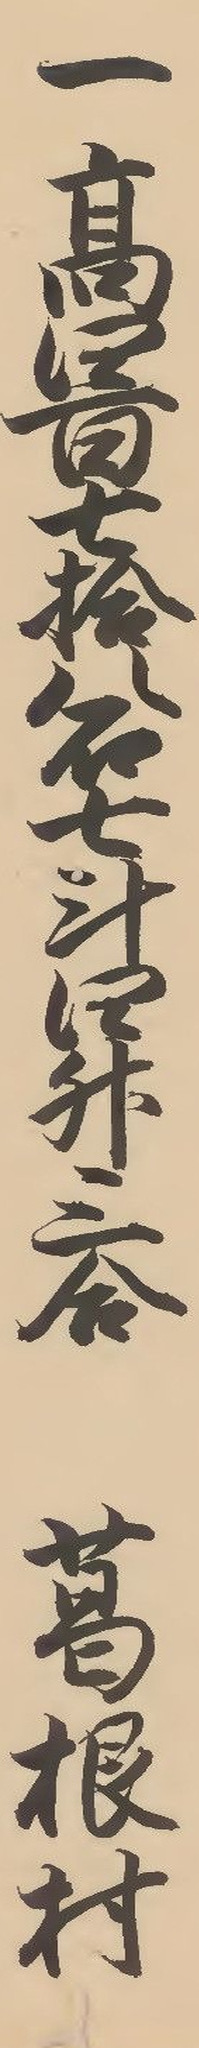一髙四百七拾八石七斗四升三合葛根村
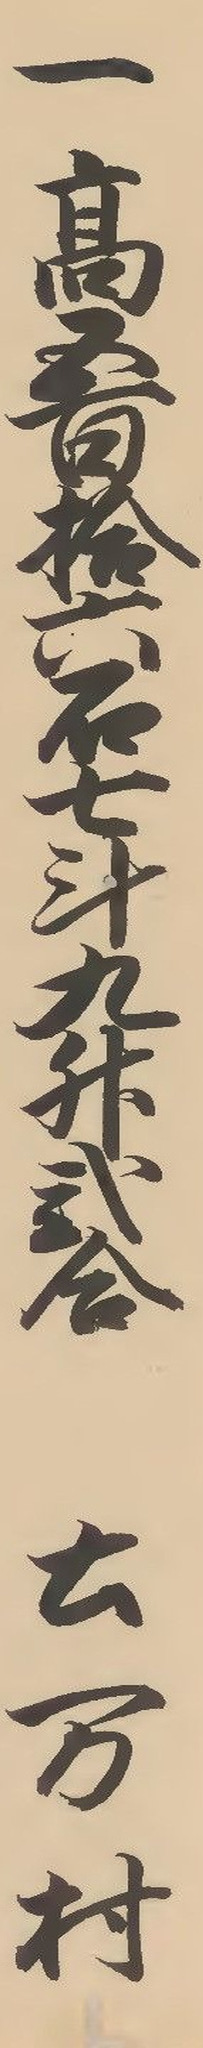一髙五百拾六石七斗九升弐合土方村
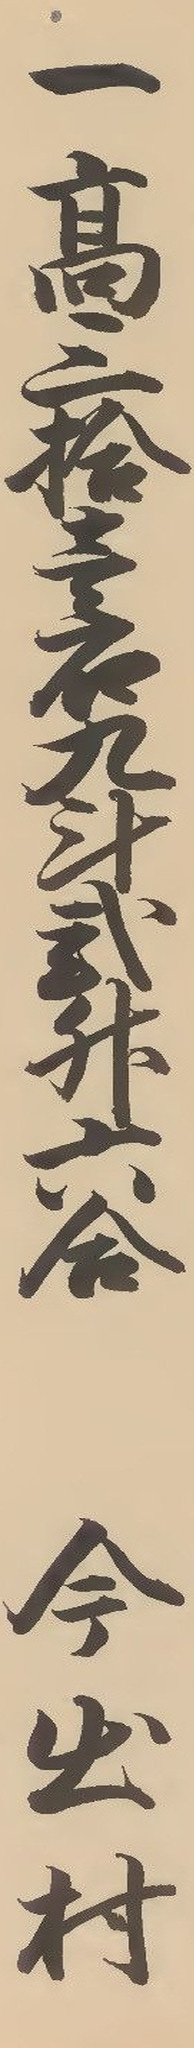一髙三拾壱石九斗弐升六合今出村
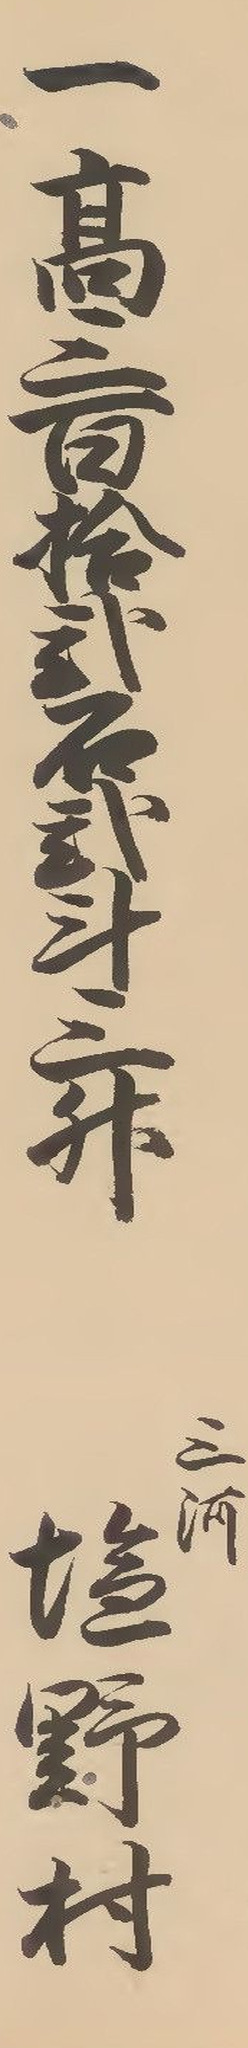一髙三百拾弐石弐斗三升塩野村
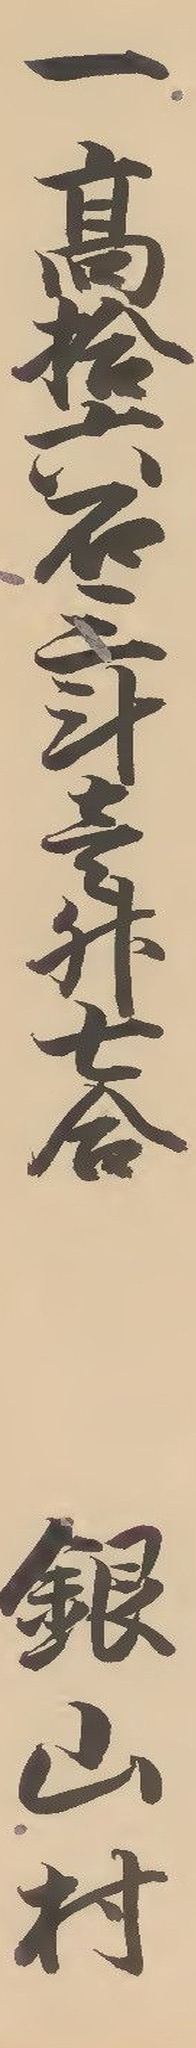一髙拾六石三升壱升七合銀山村

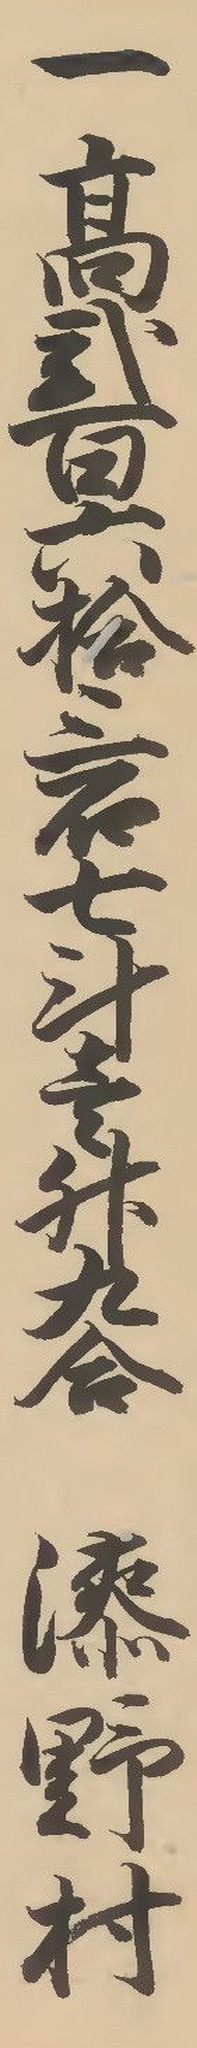一髙弐百六拾三石七斗壱升九合漆野村
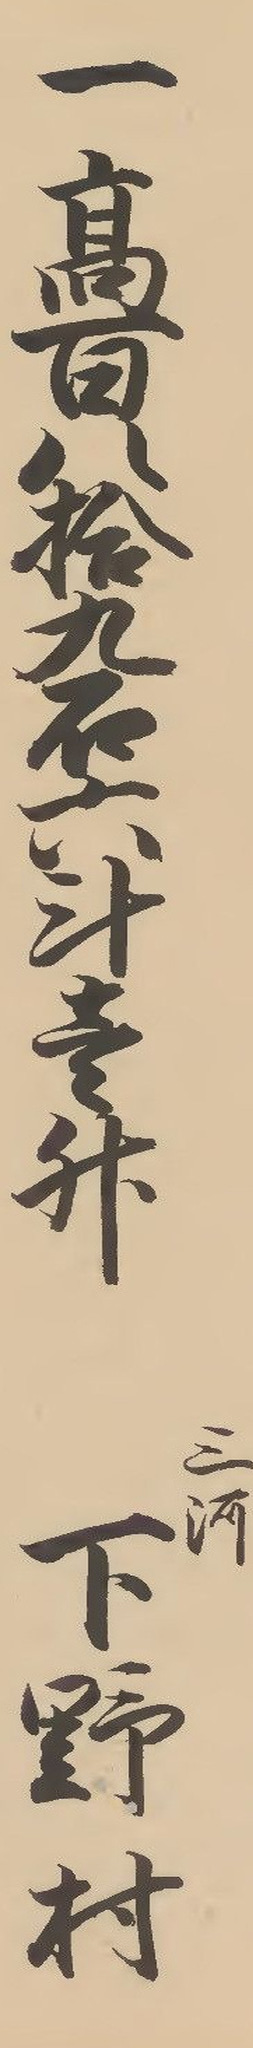一髙百八拾九石六斗壱升下野村
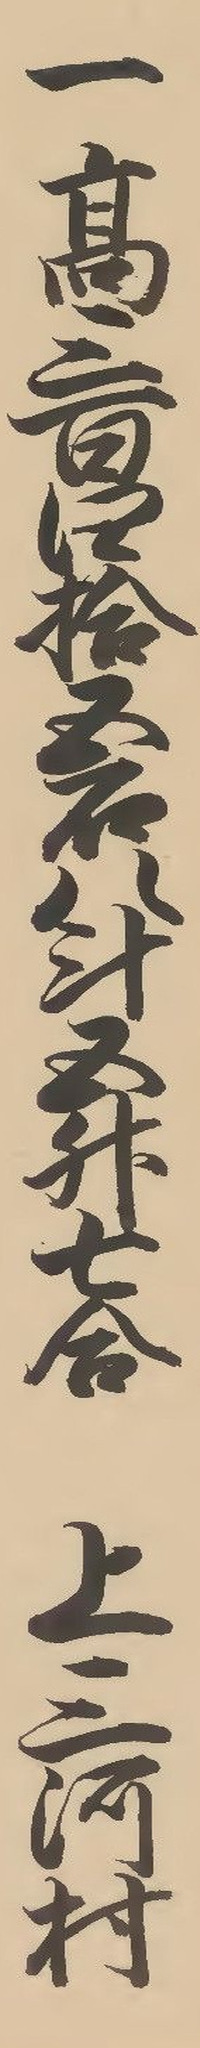一髙三百四拾五石八斗五升七合上三河村
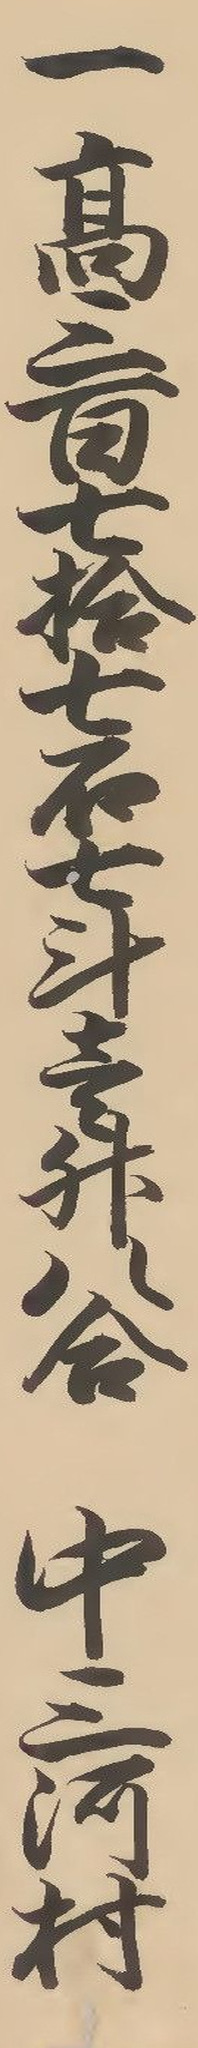一髙三百七拾七石七斗壱升八合中三河村
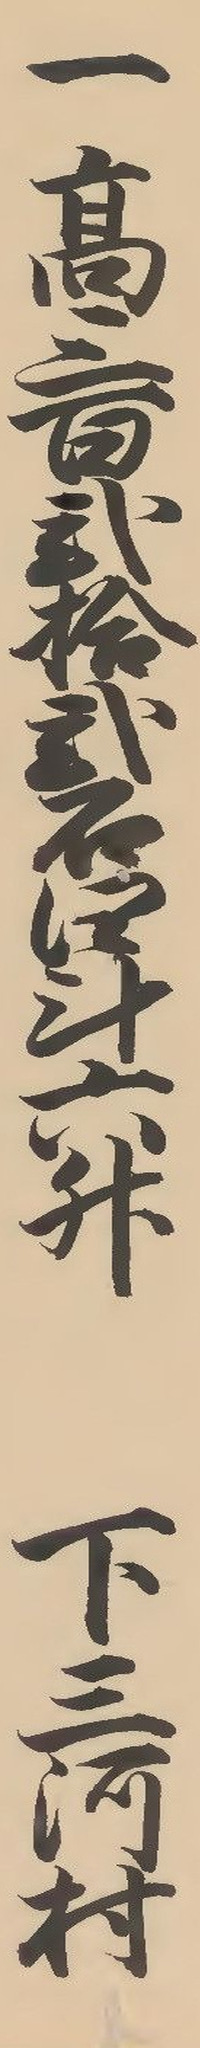一髙三百弐拾弐石四斗六升下三河村
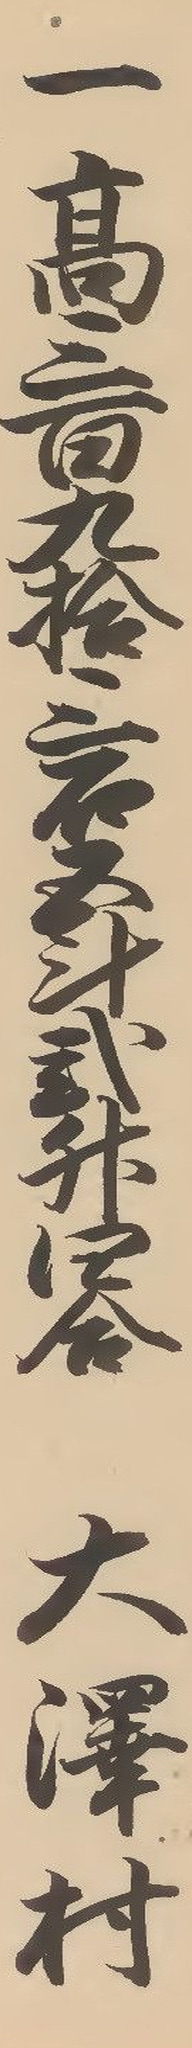一髙三百九拾三石五斗弐升四合大澤村
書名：播磨国郷帳
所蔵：国立公文書館 National Archives of Japan
